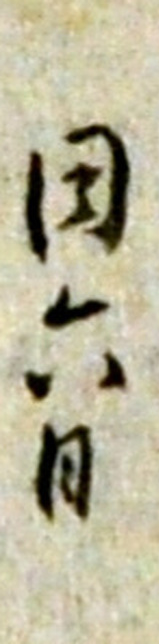同六日
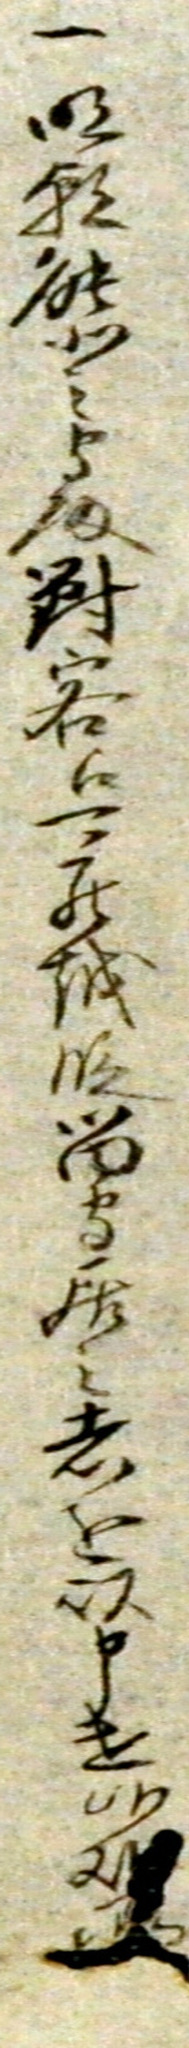一明朝能登守殿対客江可罷越段留守居之者を以申遣候処為
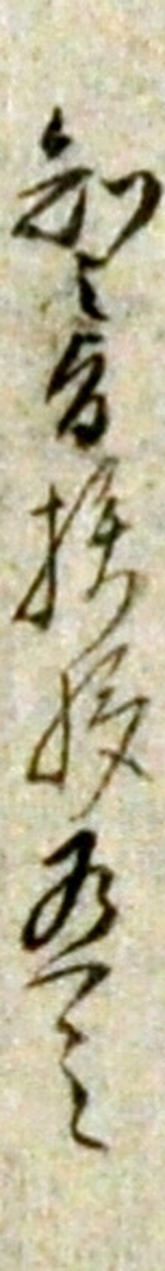承知之旨挨拶有之
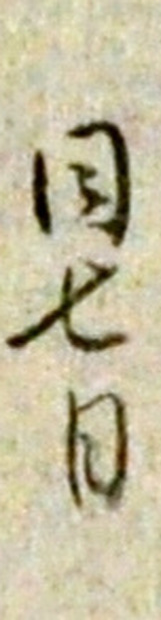同七日
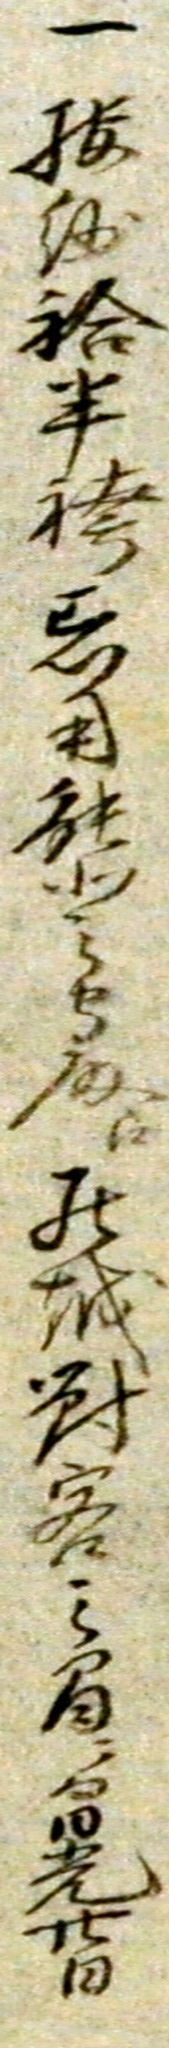一服紗半袴着用能登守殿江罷越対客之ニ而日光廿日
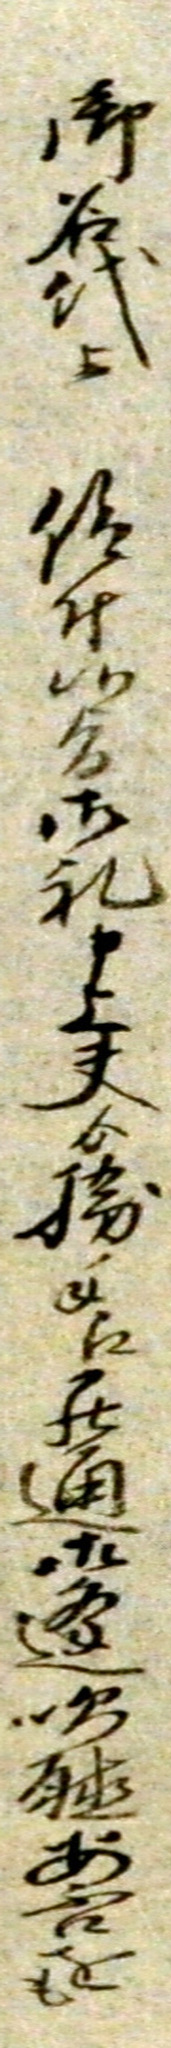御名代被仰付候旨御礼申上夫ゟ勝手江罷通御逢吹聴安否をも
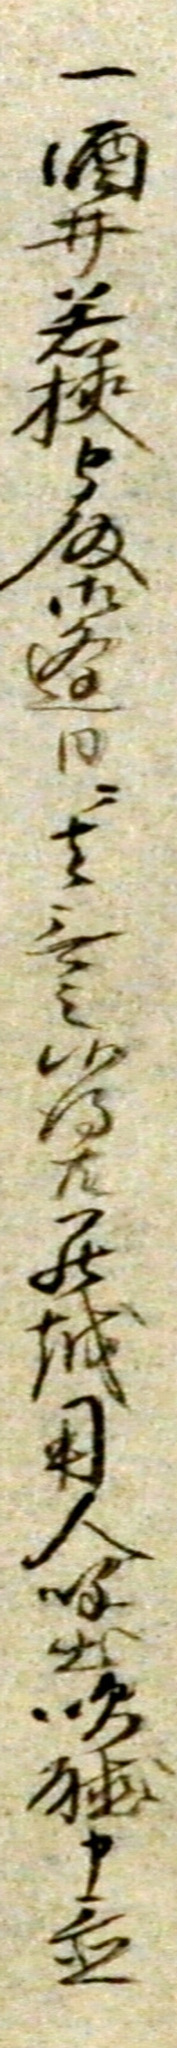一酒井若狭守殿御逢日ニ者無之候得共罷越用人呼出吹聴申置
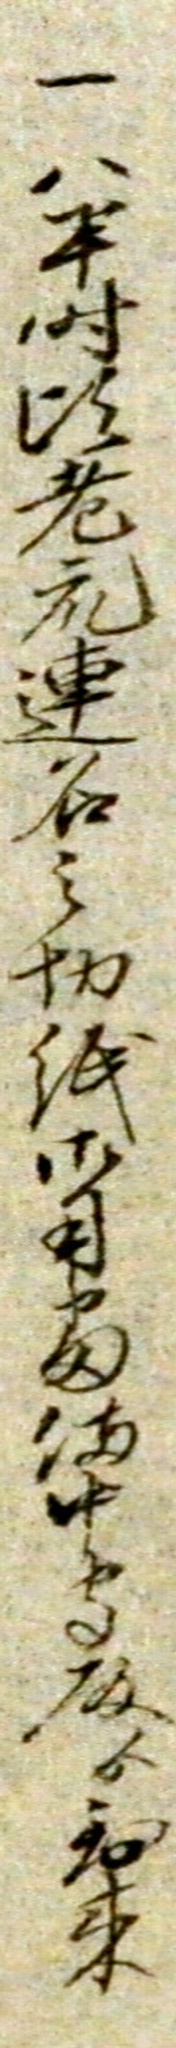一八半時頃老衆連名之切紙御用番備中守殿ゟ到来
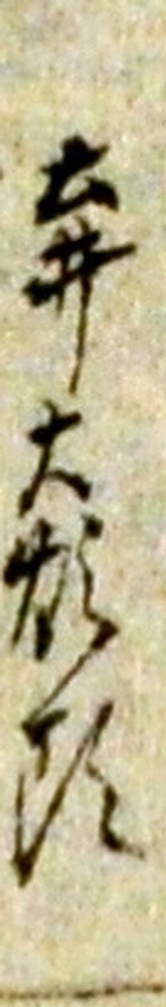土井大炊頭
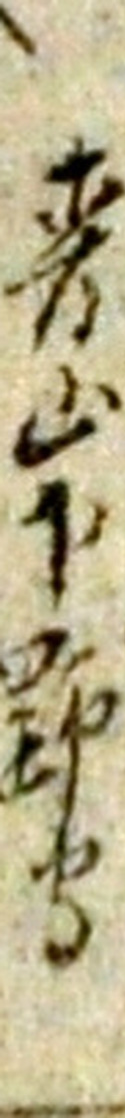青山下野守
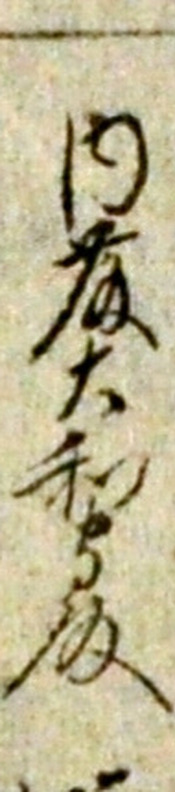内藤大和守殿
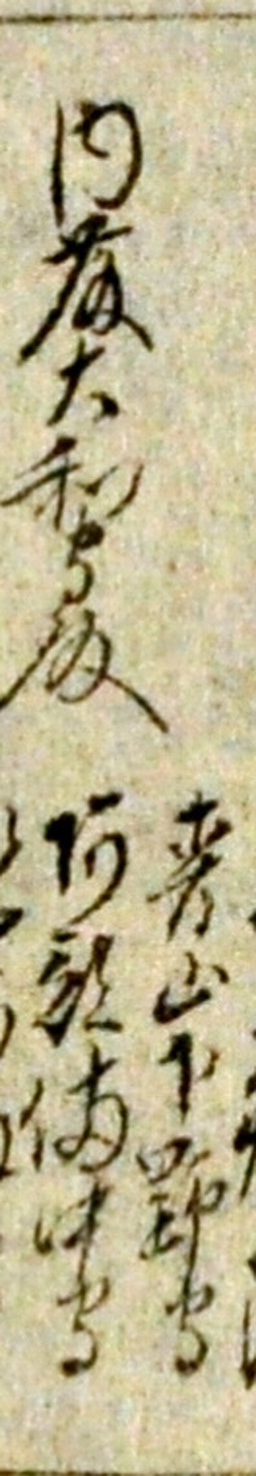内藤大和守殿阿部備中守
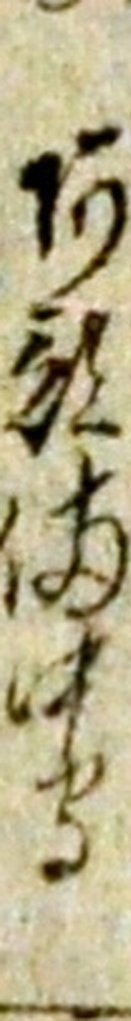阿部備中守
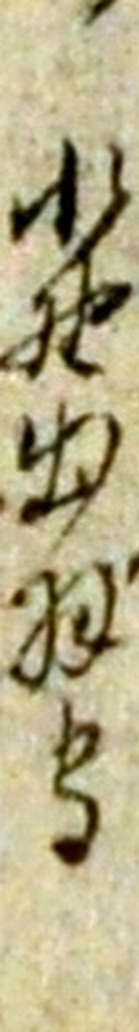水野出羽守
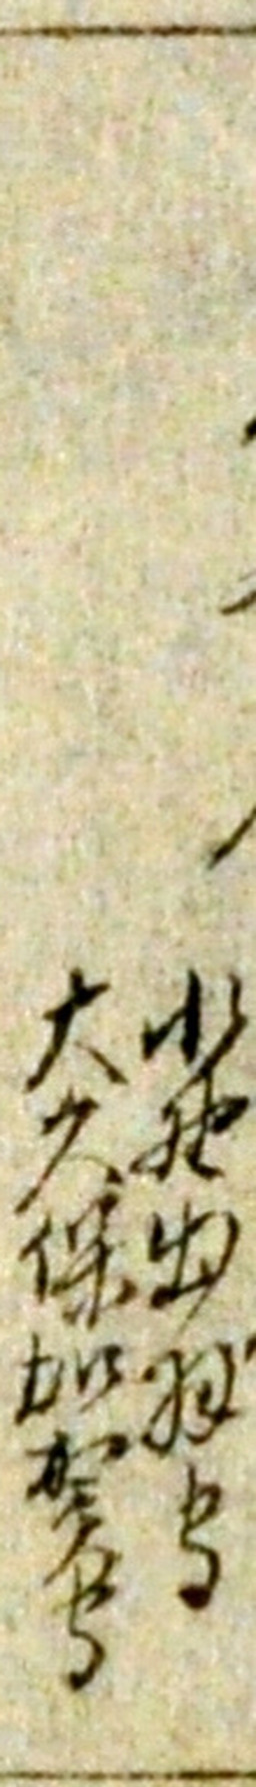大久保加賀守
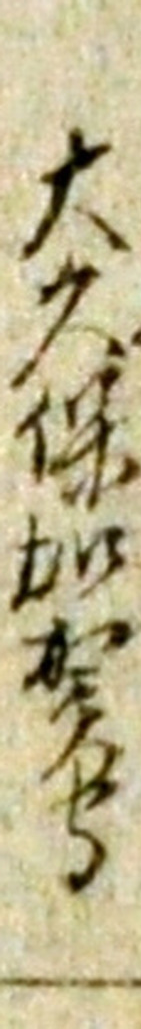大久保加賀守
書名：日光御名代相勤候節ノ留
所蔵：伊那市立高遠町図書館・合同会社AMANE
